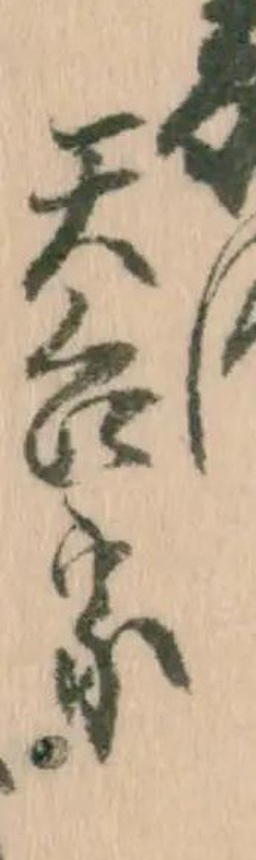天台宗
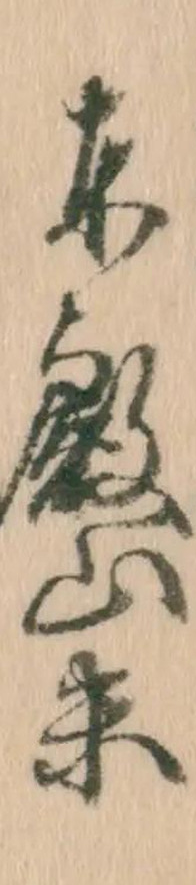東叡山末
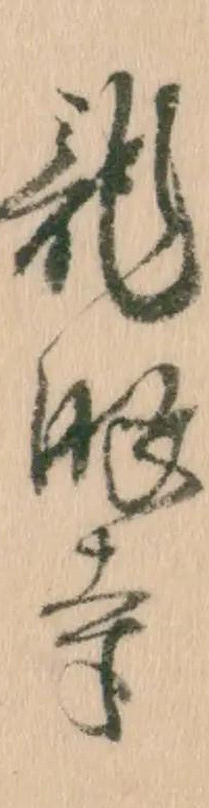龍眼寺
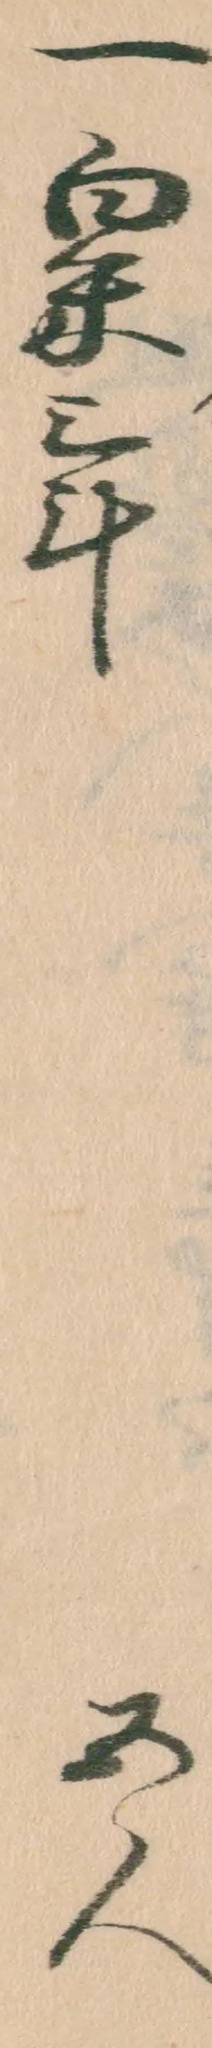一白米三斗店借

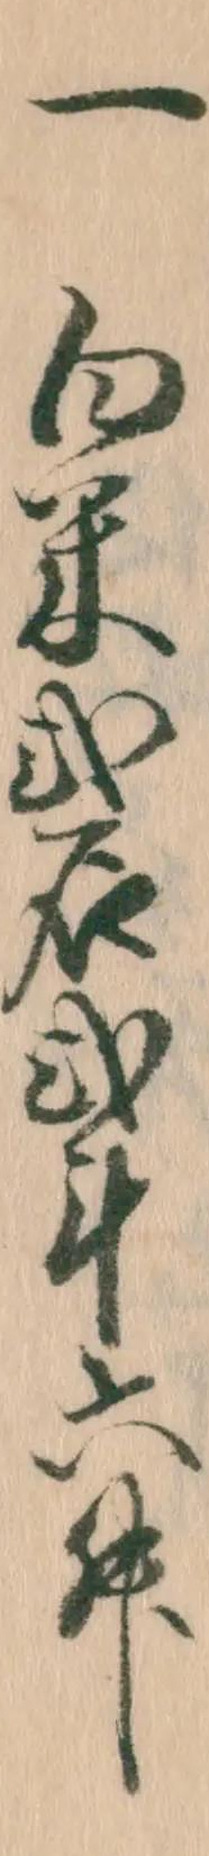一白米弐石弐斗六升
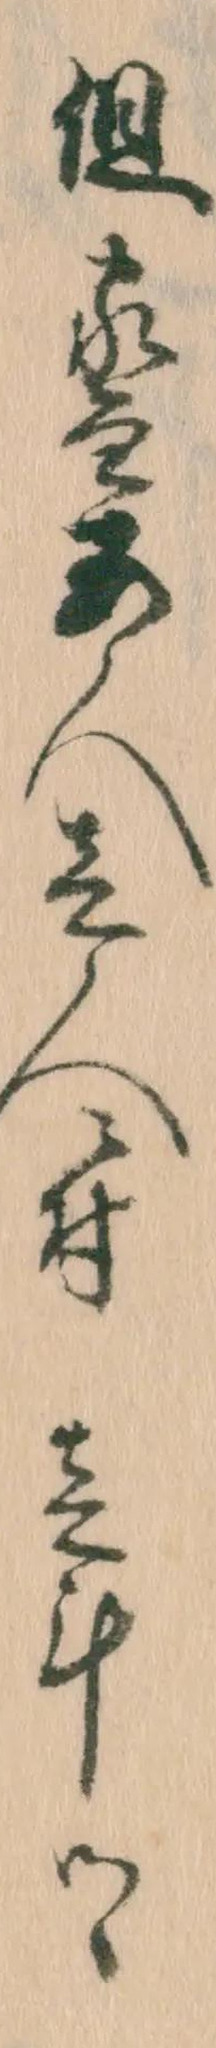但家主五人壱人ニ付壱斗ツヽ
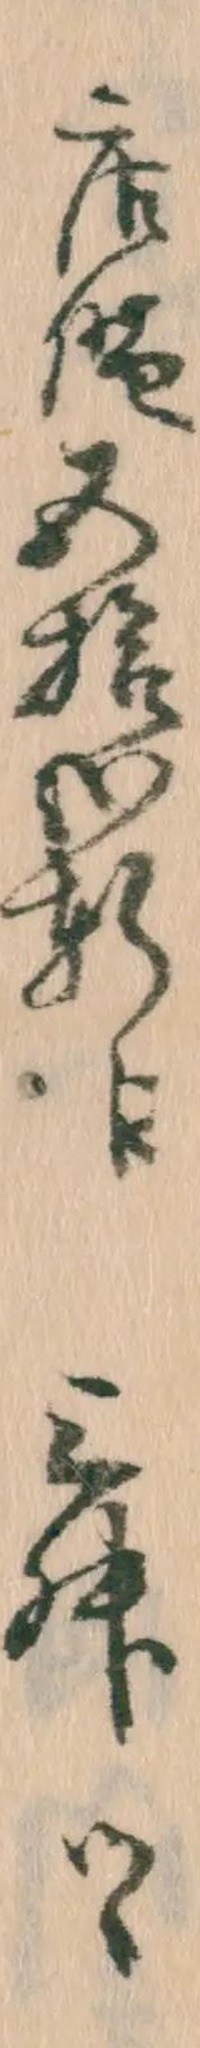店借五拾弐軒え三升ツヽ
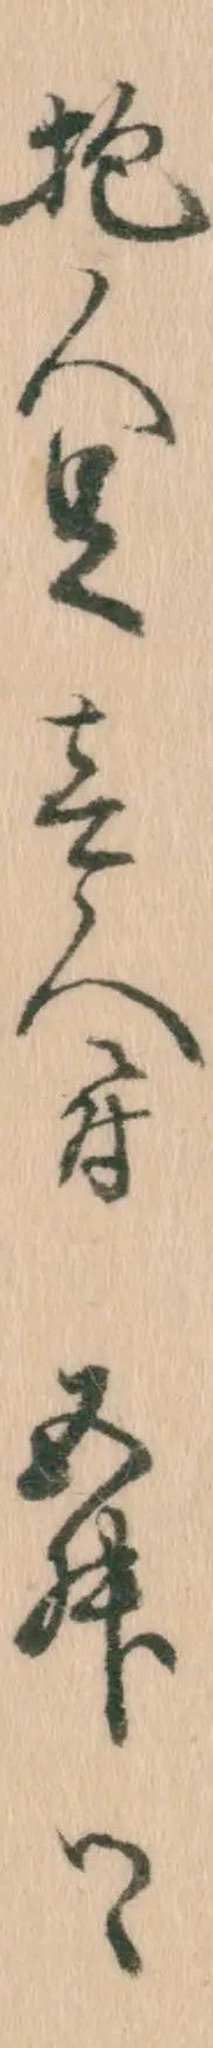抱人足壱人ニ付五升ツヽ
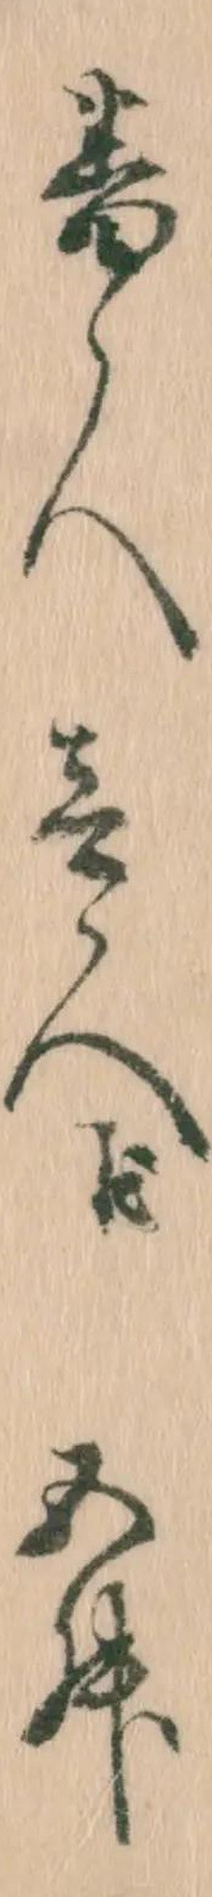番人壱人え五升
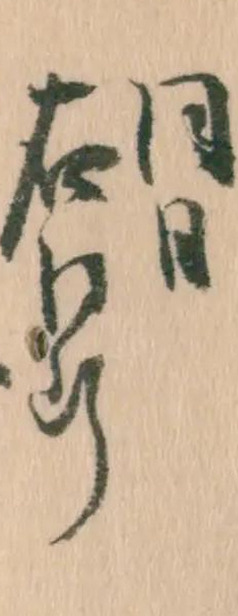右同断
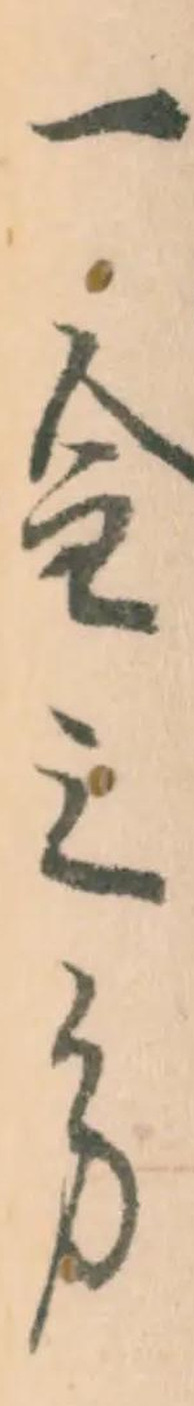一金三分
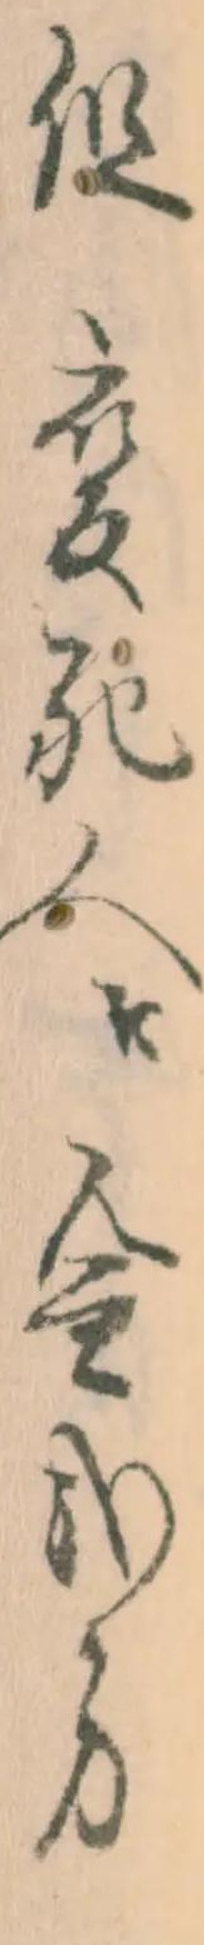但変死人え金弐分
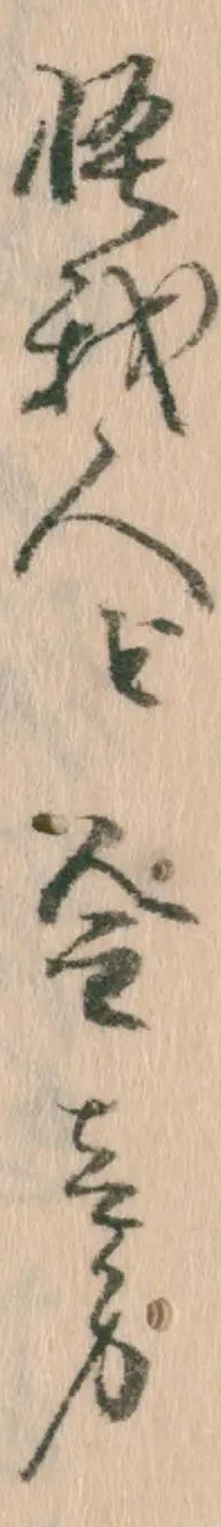怪我人え金壱分
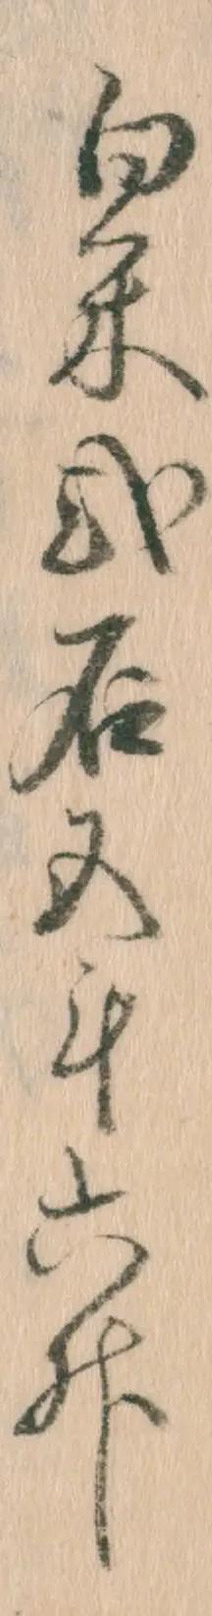一白米弐石弐斗六升
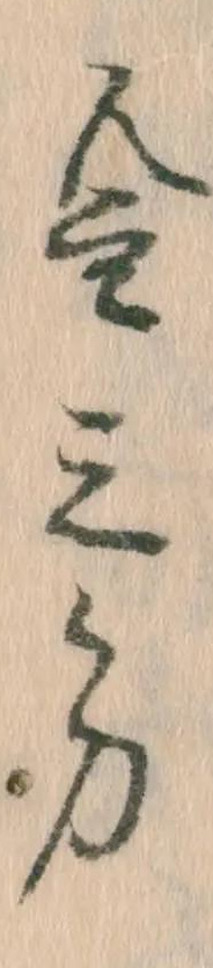金三分
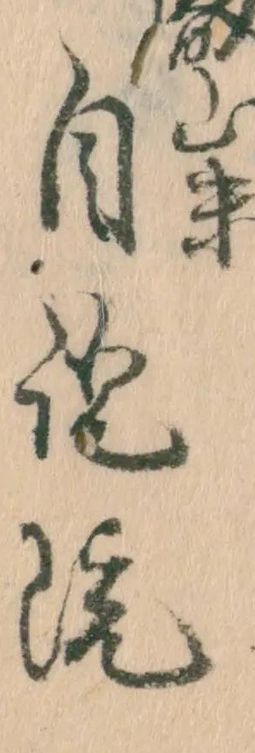自証院
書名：武家方并寺院等ニテ施差出候一件
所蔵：国立国会図書館 National Diet Library, JAPAN
